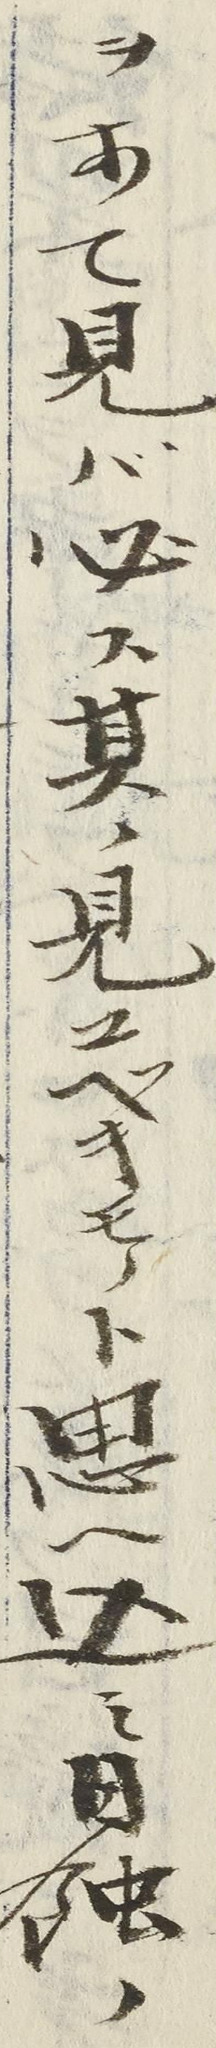ヲあて見バ必ㇲ其ノ見ユベキモノト思へ込ミ日蝕ノ
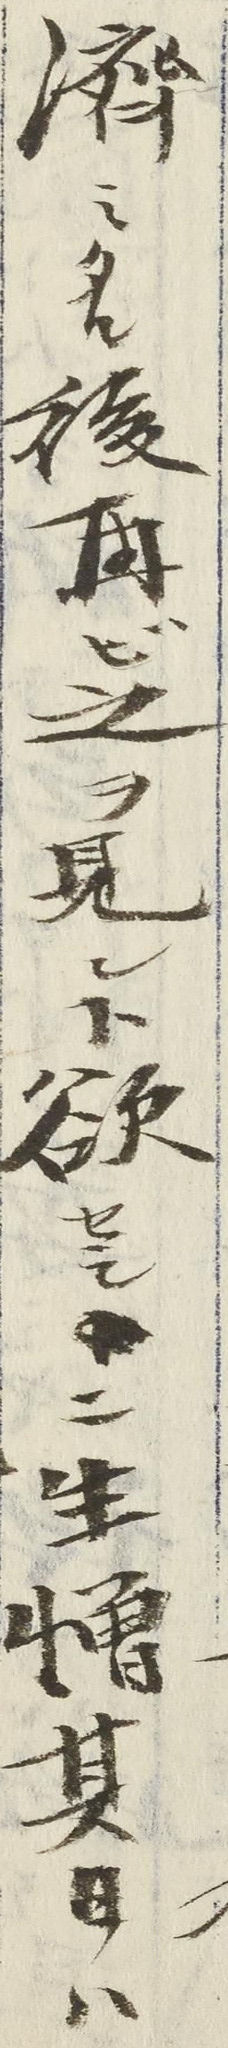済ミタル後再ビ之ヲ見レト欲セシ二生憎其日ハ
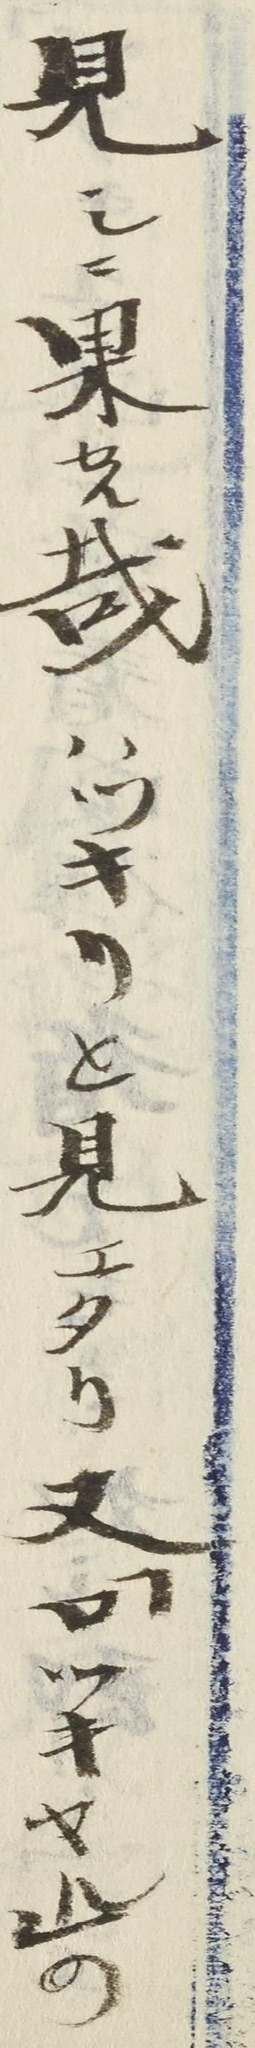見シ二果セン哉ハツキリと見エタリ又「ロツキヤル」の
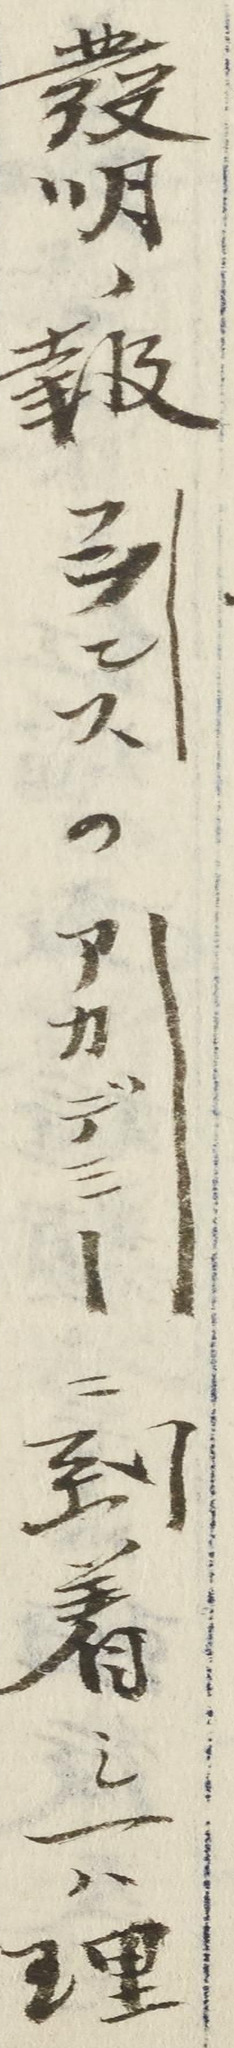発明ノ報フランスのアカデミー二到着之一ハ理
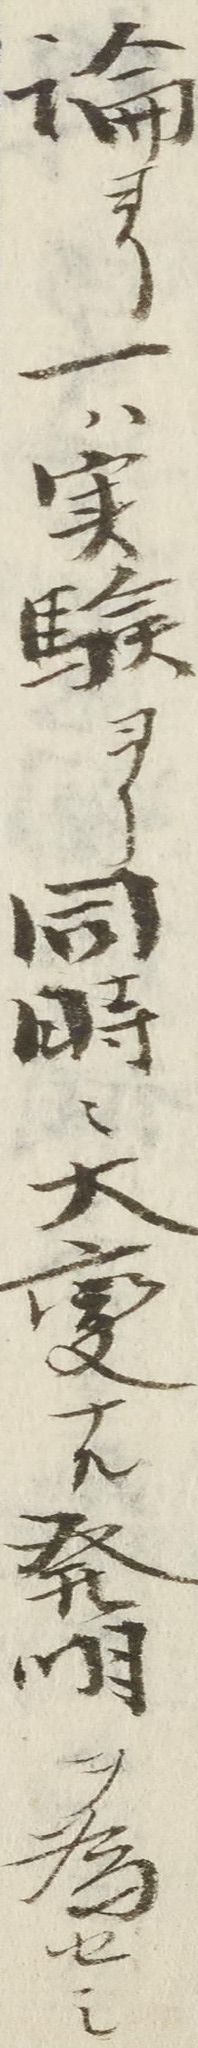論ヨリ一ハ実験ヨリ同時二大変ナル発明ヲ為せし
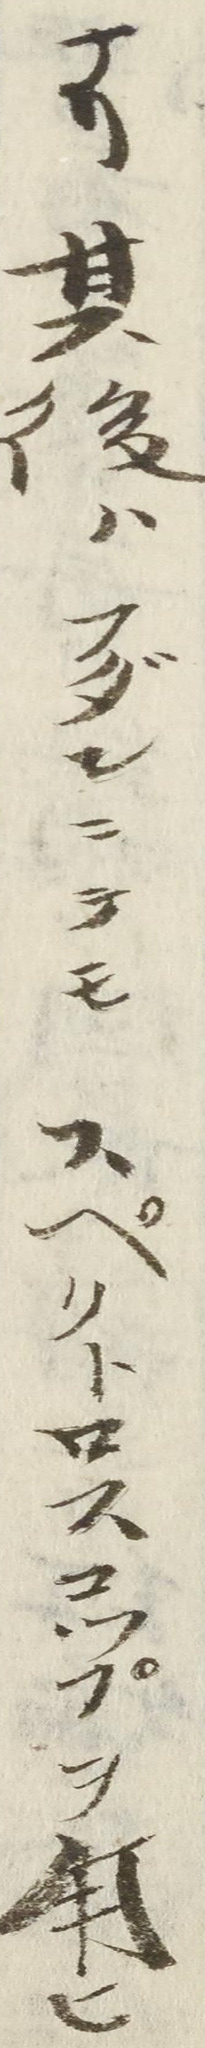ナリ其後はフダン二テモㇲぺクトロスコップヲ用ヒ
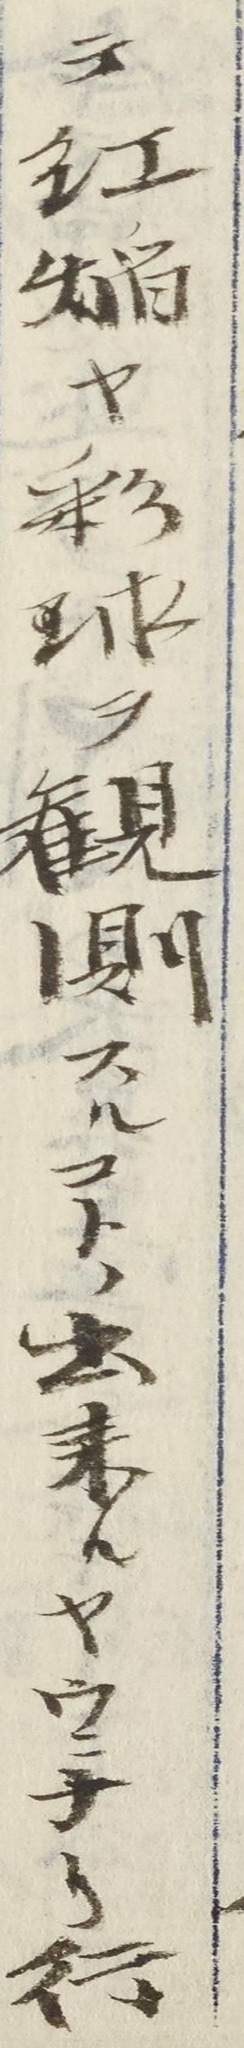テ紅焔ヤ彩球ヲ観測スルコトノ出来ㇽヤウ二ナリ行
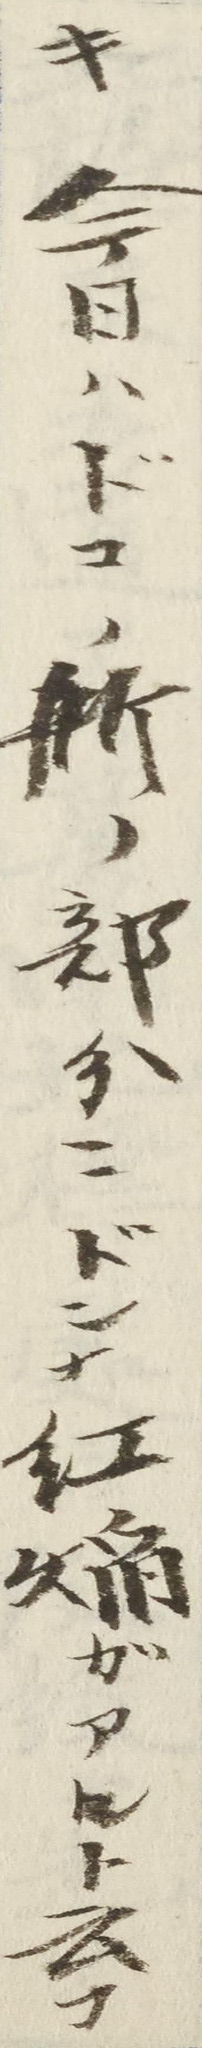キ今日ハドコノ所ノ部分二ドンナ紅焔がアルト云フ
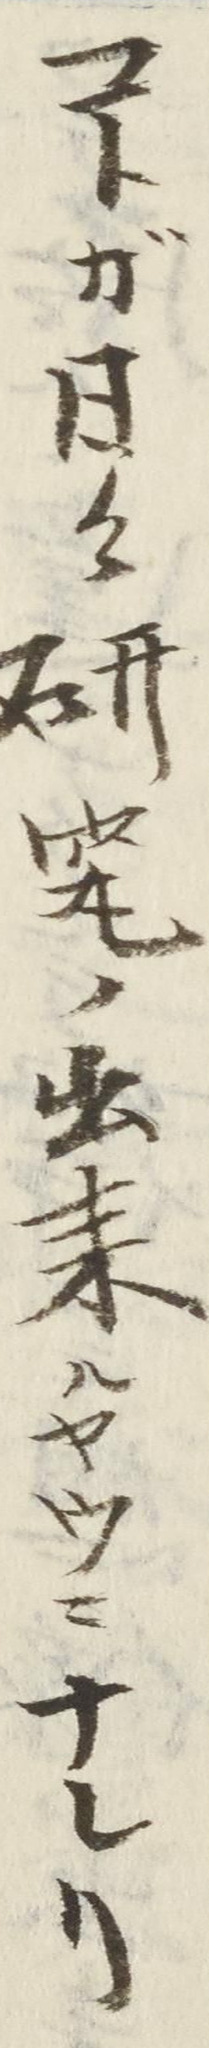コトガ日々研究ノ出来ㇽヤウ二ナレリ
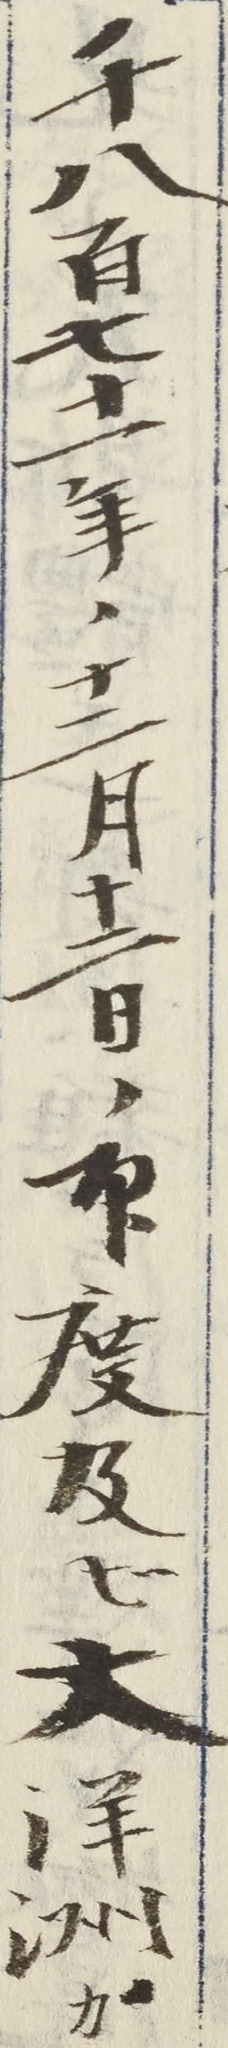千八百七十一年ノ十二月十二日ノ印度及ビ大洋洲カ
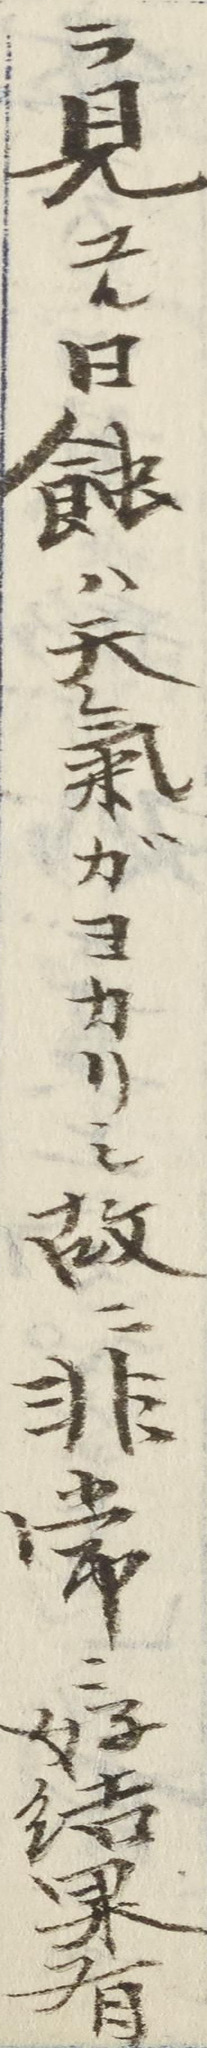ラ見ユル日蝕ハ天気ガヨカリシ故二非常二好結果有
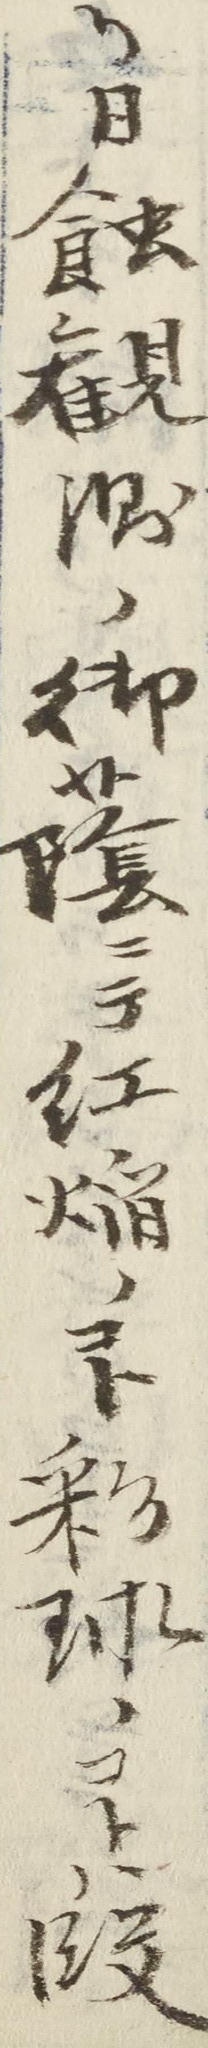り日蝕観測ノ御蔭ニテ紅焔ノコト彩球ノコトハ段

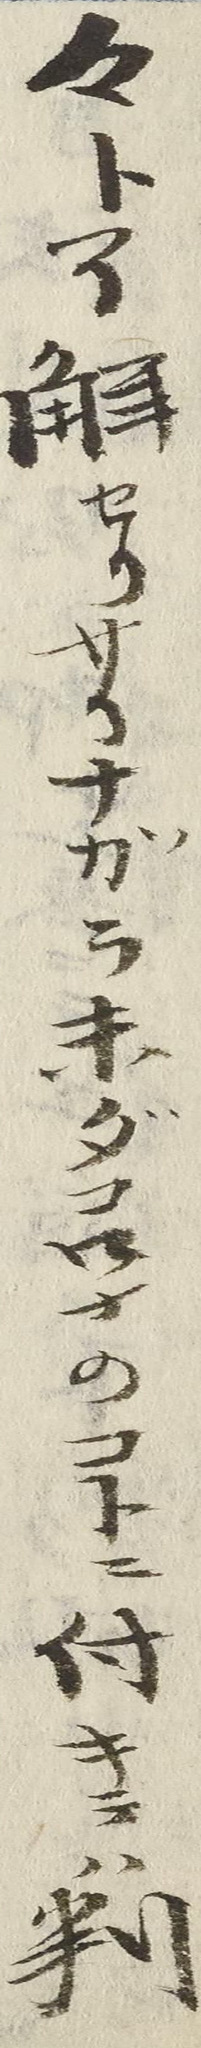々ㇳ了解セリサリナガラ未ダコロナ二付キテハ判
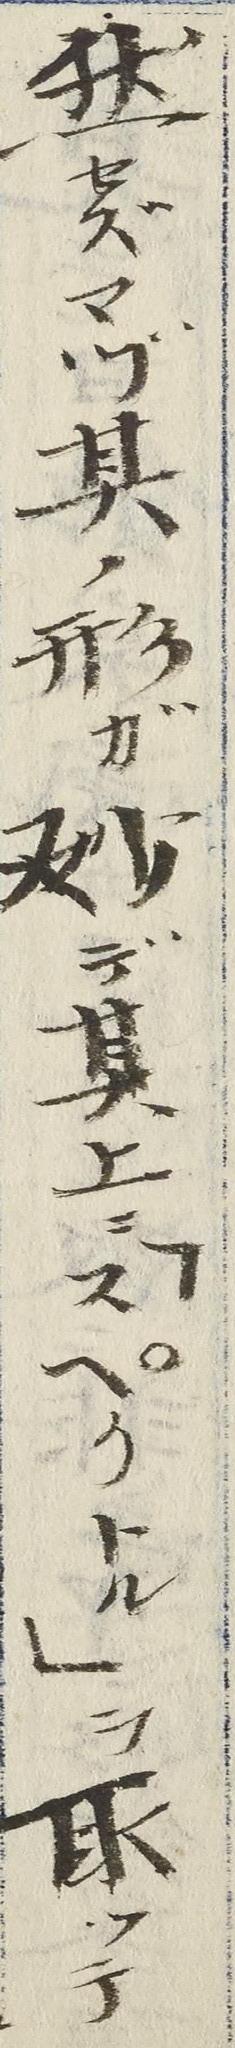然セズマヅ其ノ形が妙デ其上二「スペクトル」ヲ取ッテ
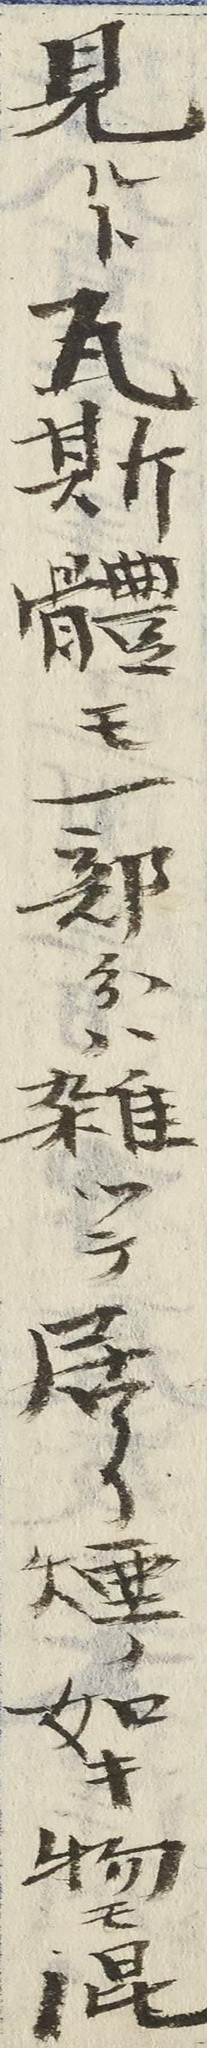見ルト瓦斯体モ一部分ハ雑ッテ居り煙ノ如キ物モ混
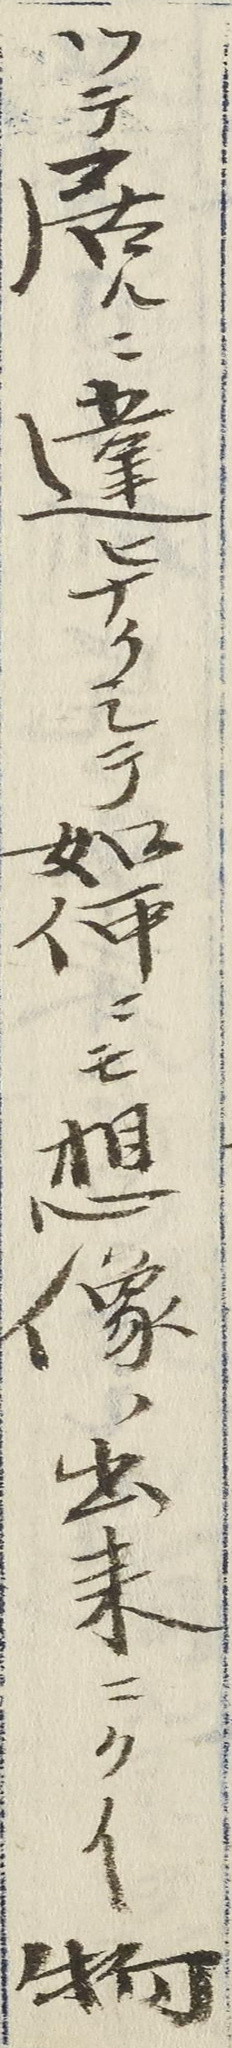ッテ居ㇽ二違ヒナクシテ如何二モ想像ノ出来二クイ物
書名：日蝕録　全
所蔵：東京大学地震研究所図書室 Earthquake Research Institute Library, The University of Tokyo, JAPAN
